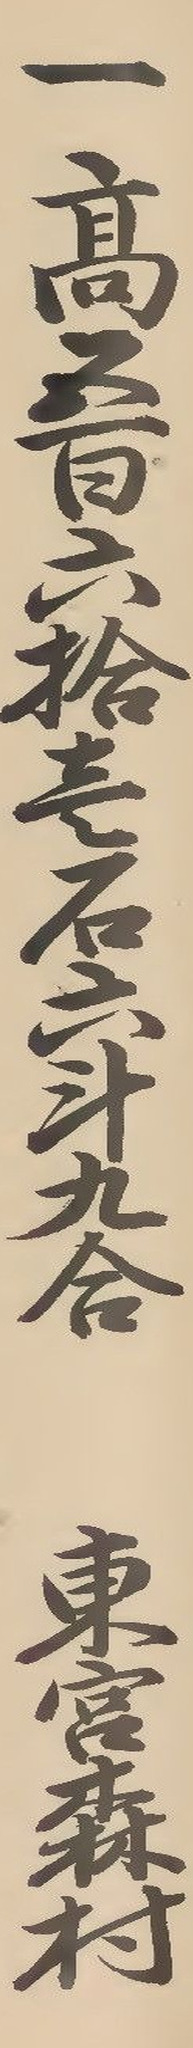一高五百六拾壱石六斗九合東宮森村
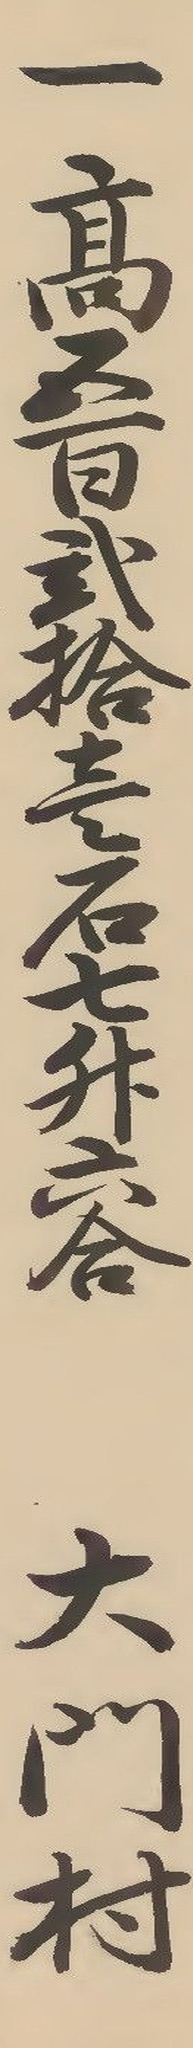一高五百弐拾壱石七升六合大門村
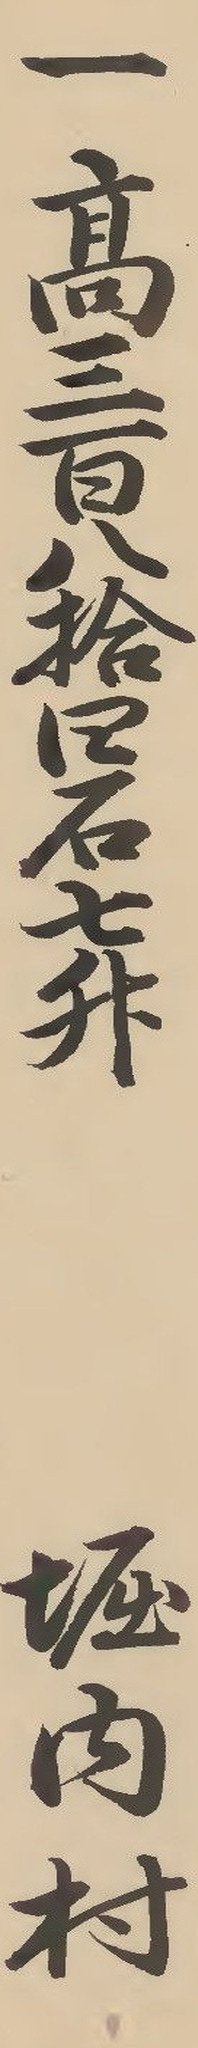一高三百八拾四石七升堀内村
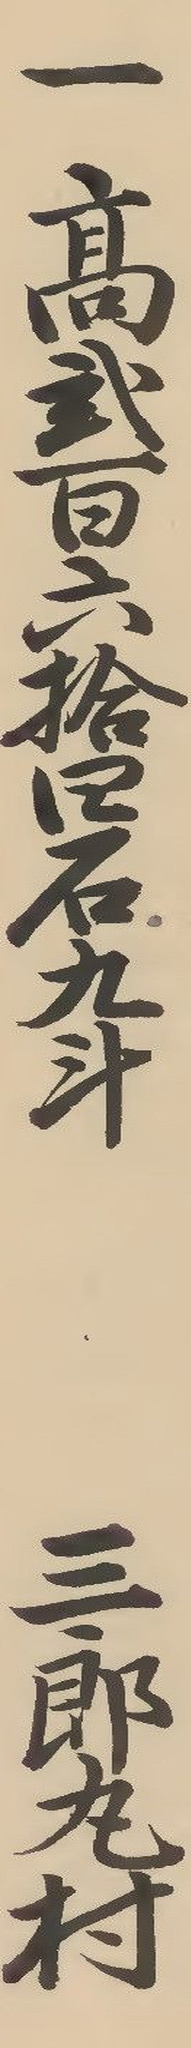一高弐百六拾四石九斗三郎丸村

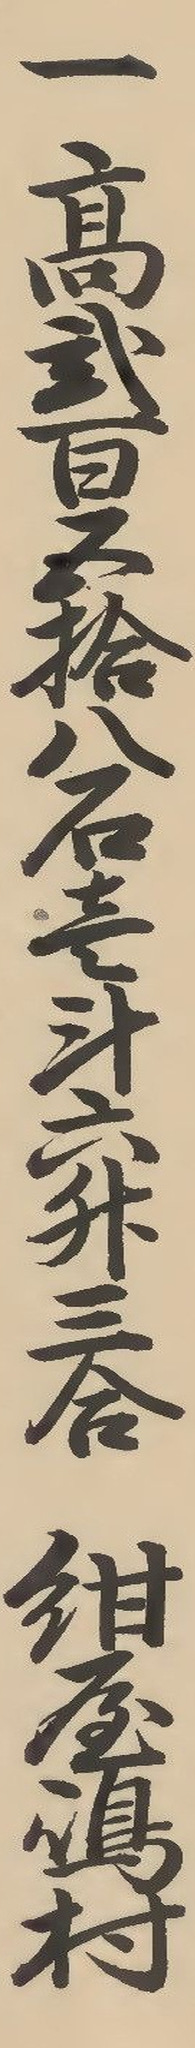一高弐百五拾八石壱斗六升三合紺屋島村
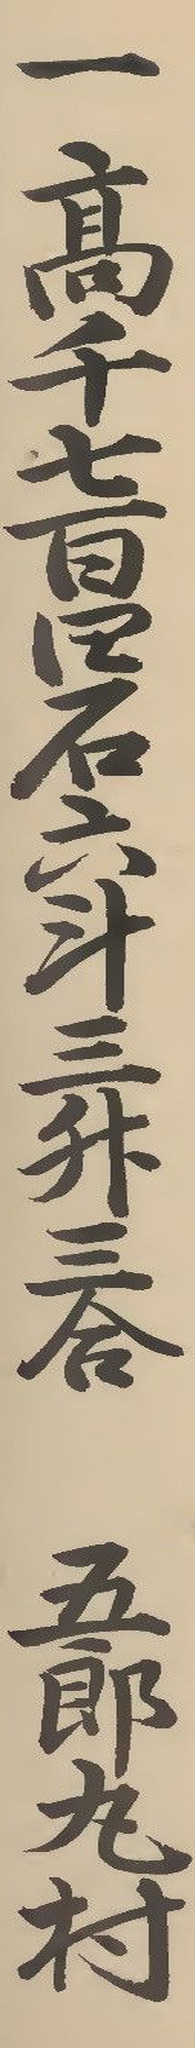一高千七百四石六斗三升三合五郎丸村
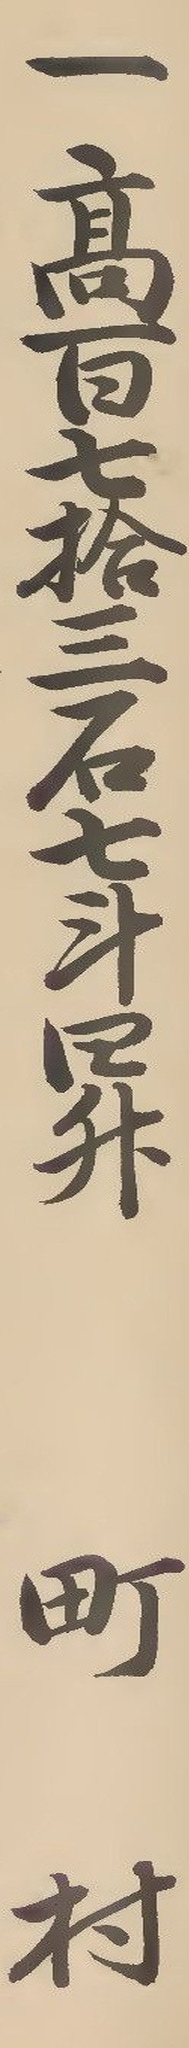一高百七拾三石七斗四升町村
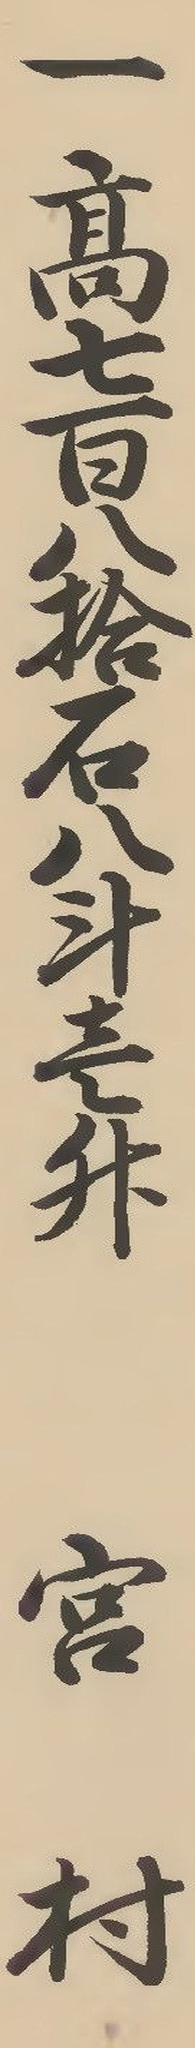一高七百八拾石八斗壱升宮村

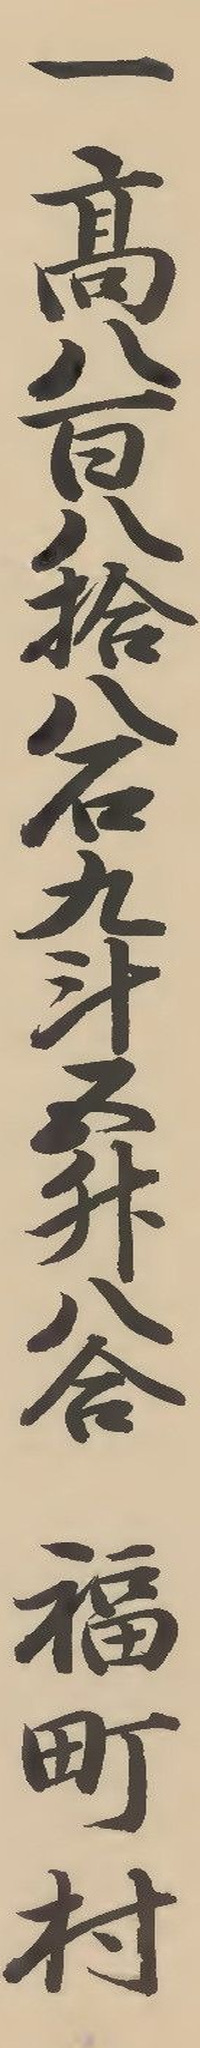一高八百八拾八石九斗五升八合福町村
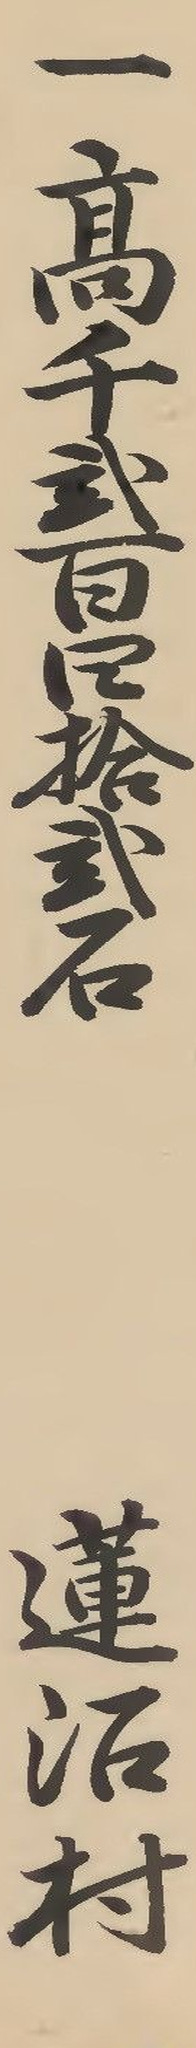一高千弐百四拾弐石蓮沼村
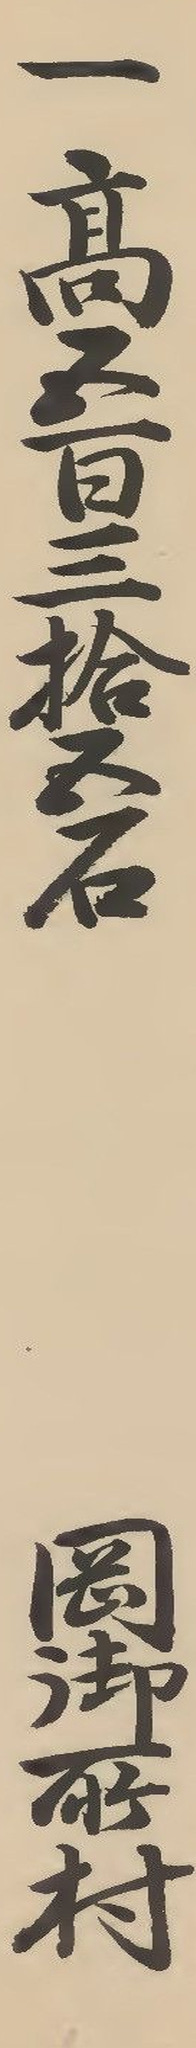一高五百三拾五石岡御所村
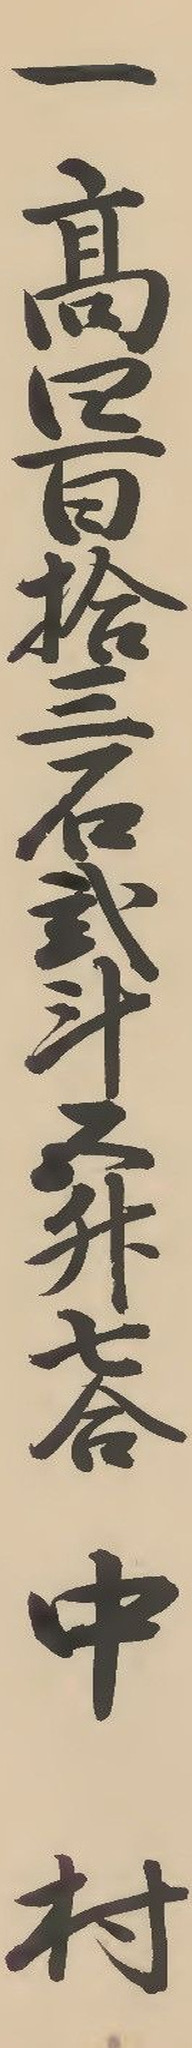一高四百拾三石弐斗五升七合中村

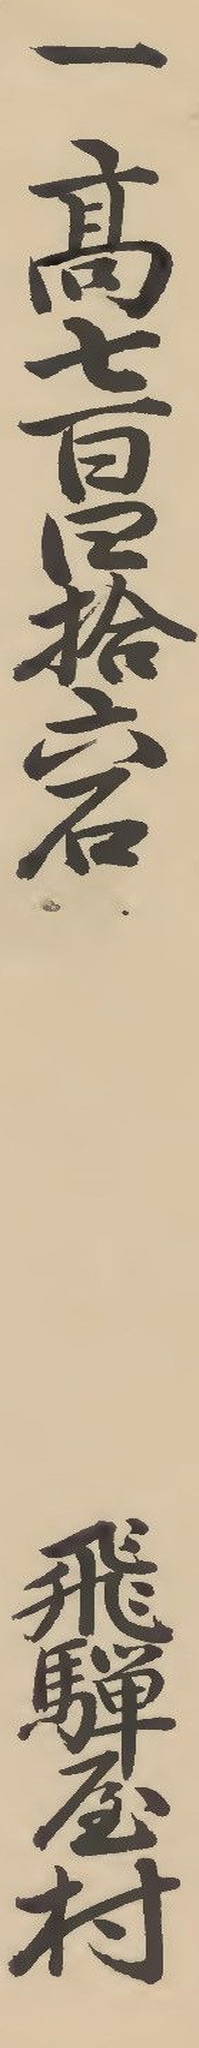一高七百四拾六石飛騨屋村
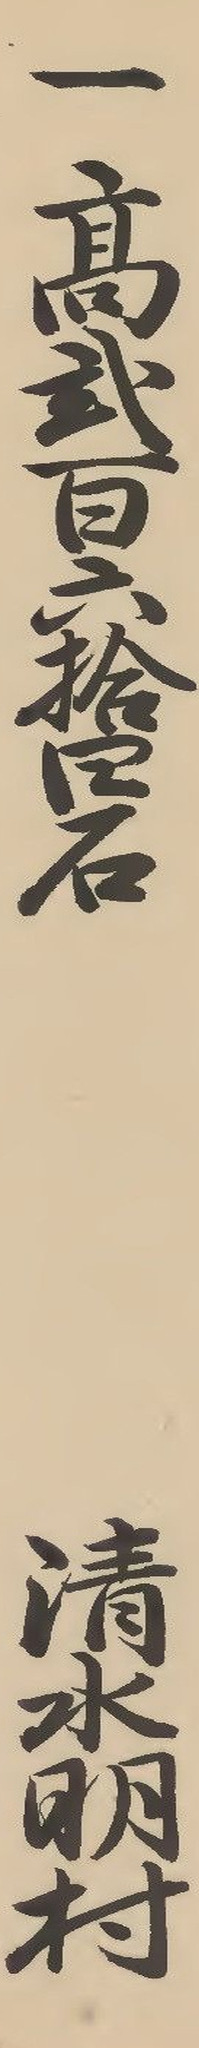一高弐百六拾四石清水明村
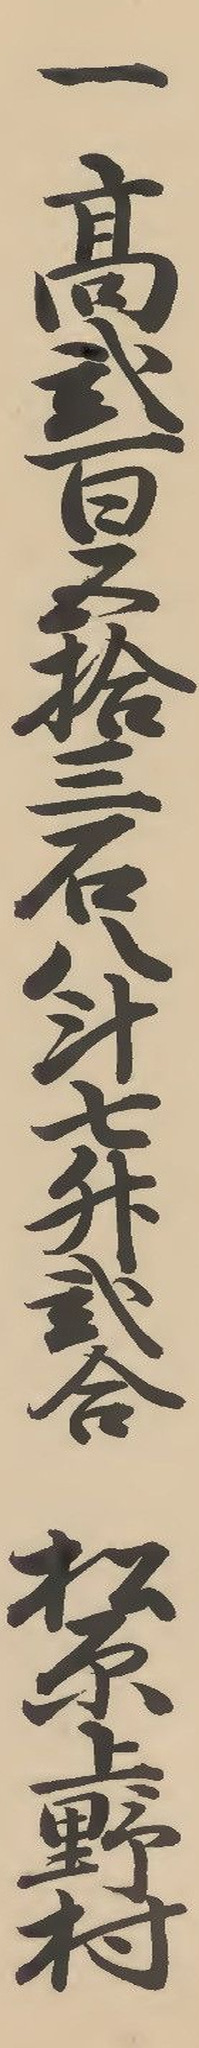一高弐百五拾三石八斗七升弐合松原上野村
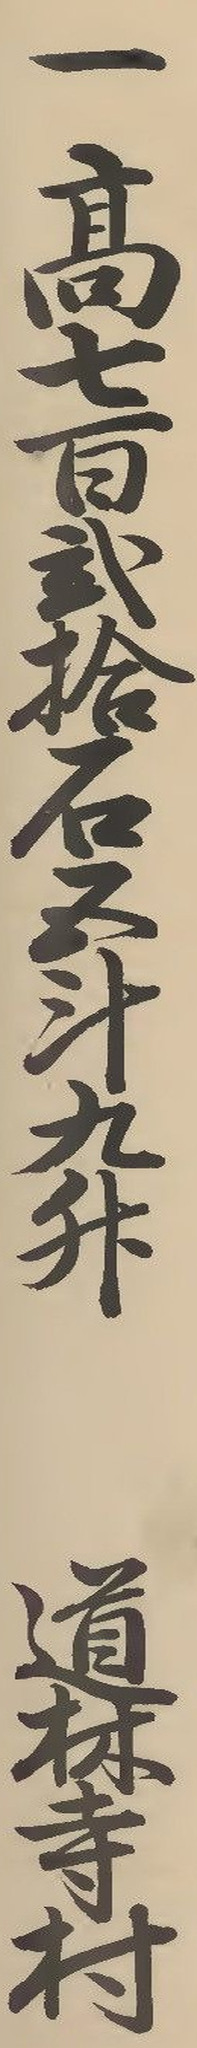一高七百弐拾石五斗九升道林寺村
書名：越中国郷帳
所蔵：国立公文書館 National Archives of Japan
